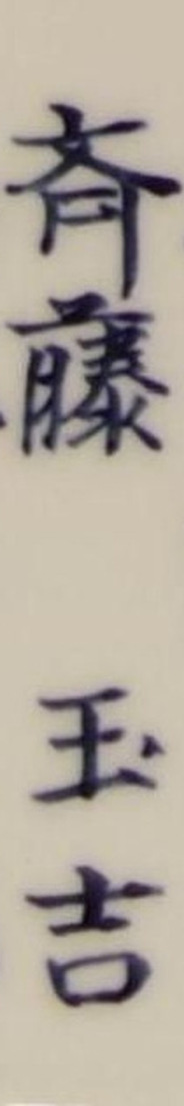斉藤玉吉
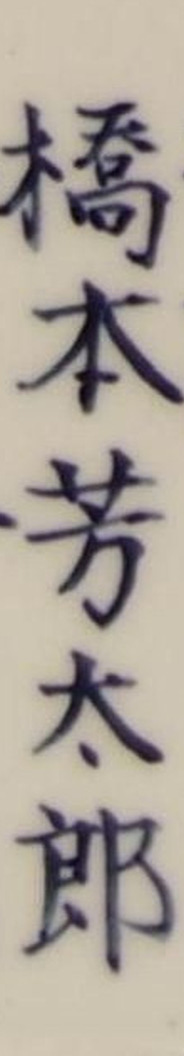橋本芳太郎
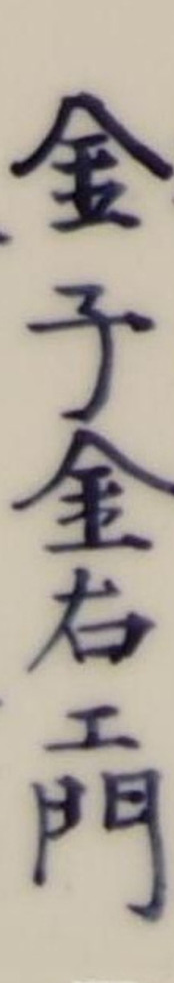金子金右エ門
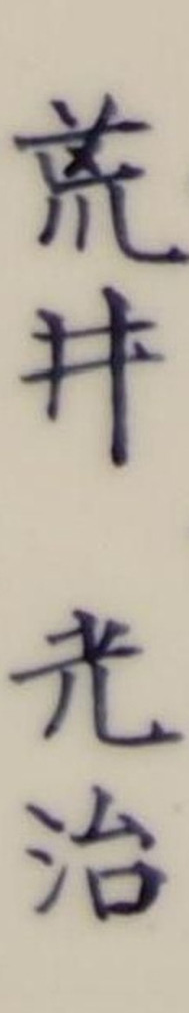荒井光治
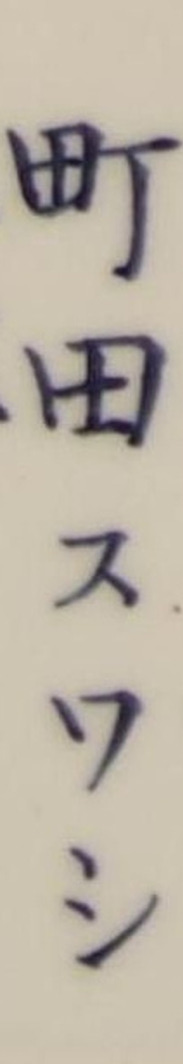町田スワシ
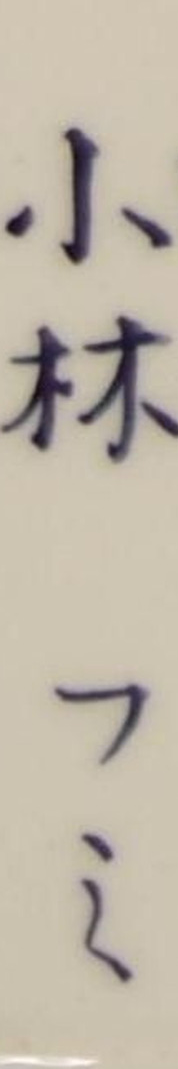小林フミ
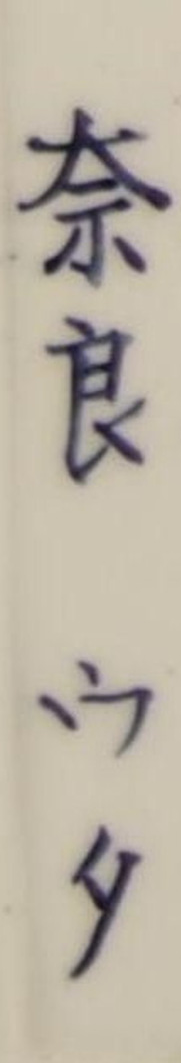奈良ウタ

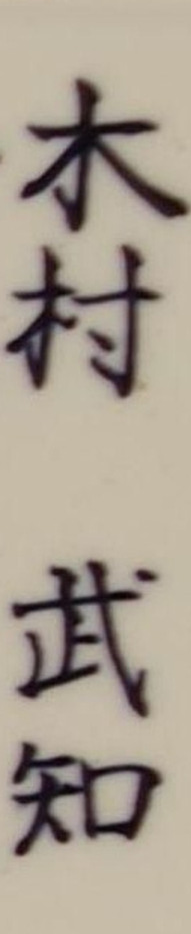木村武知
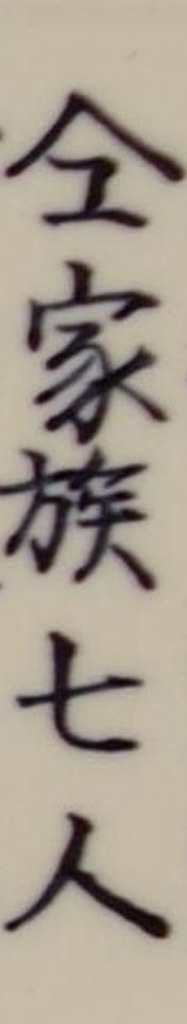同家族七人
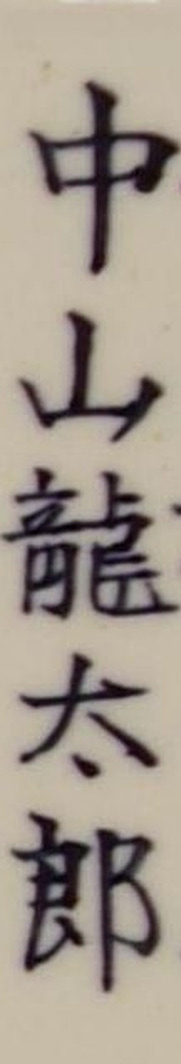中山龍太郎
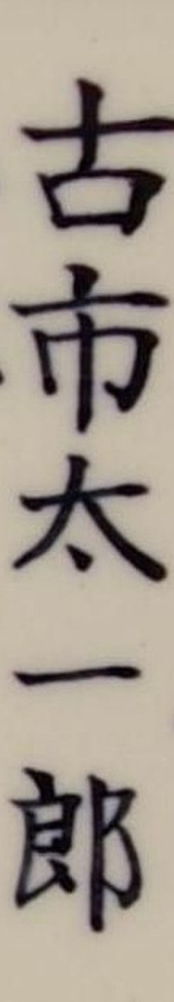古市太一郎
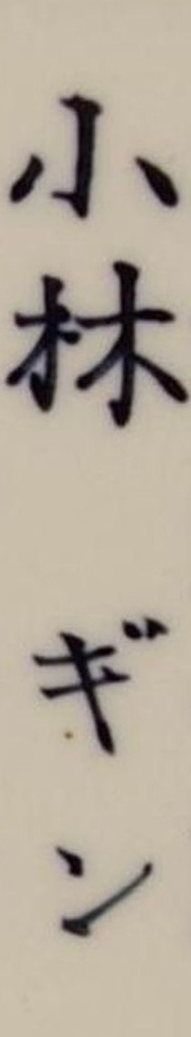小林ギン
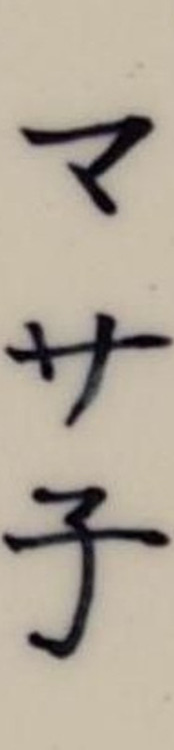マサ子
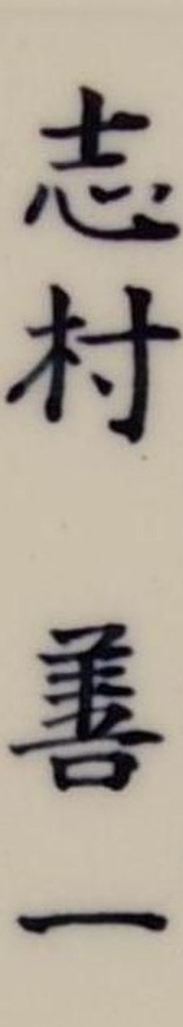志村善一
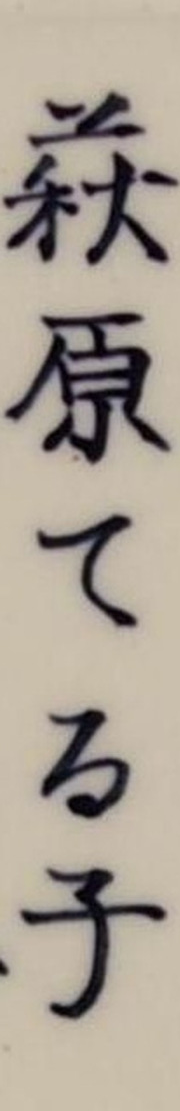萩原てる子
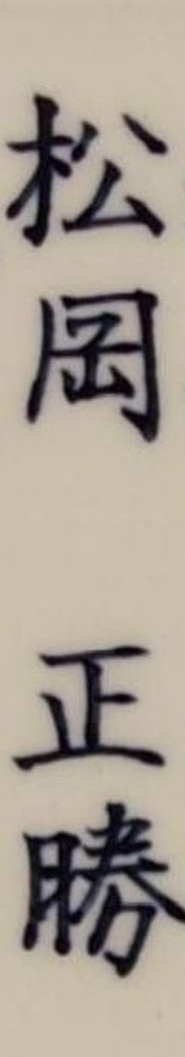松岡正勝
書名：E~L
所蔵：高野山金剛峯寺
